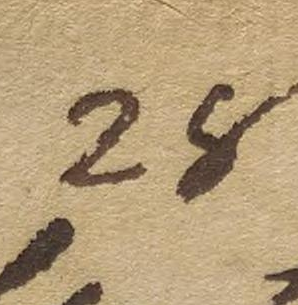28
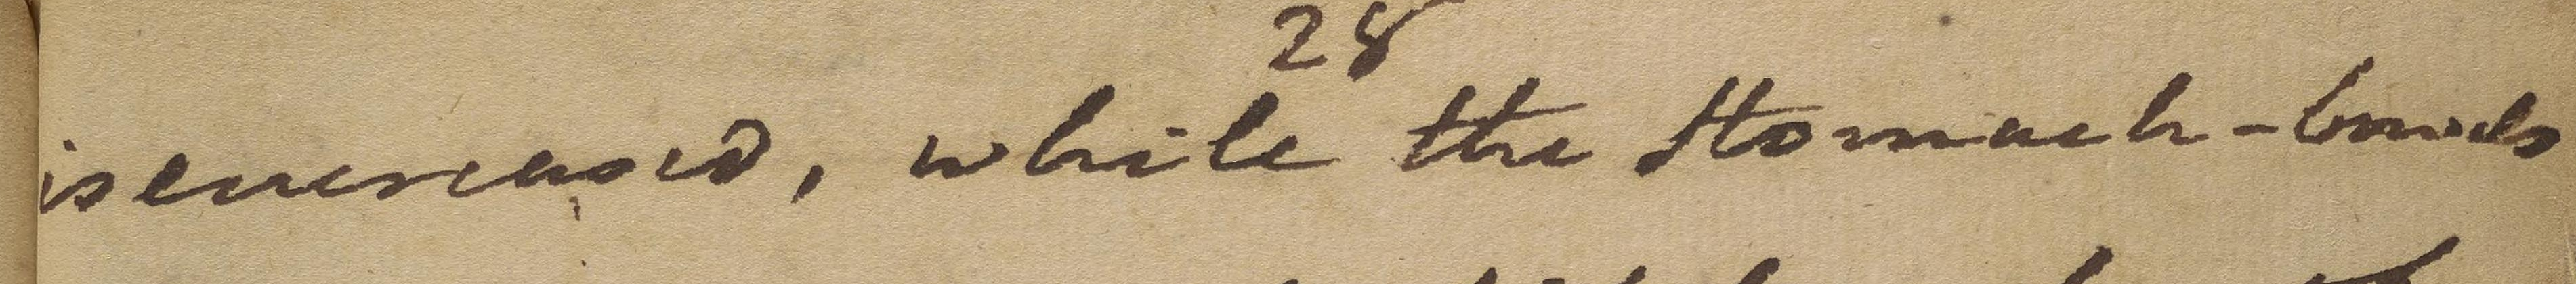is encreased, while the stomach- bowels
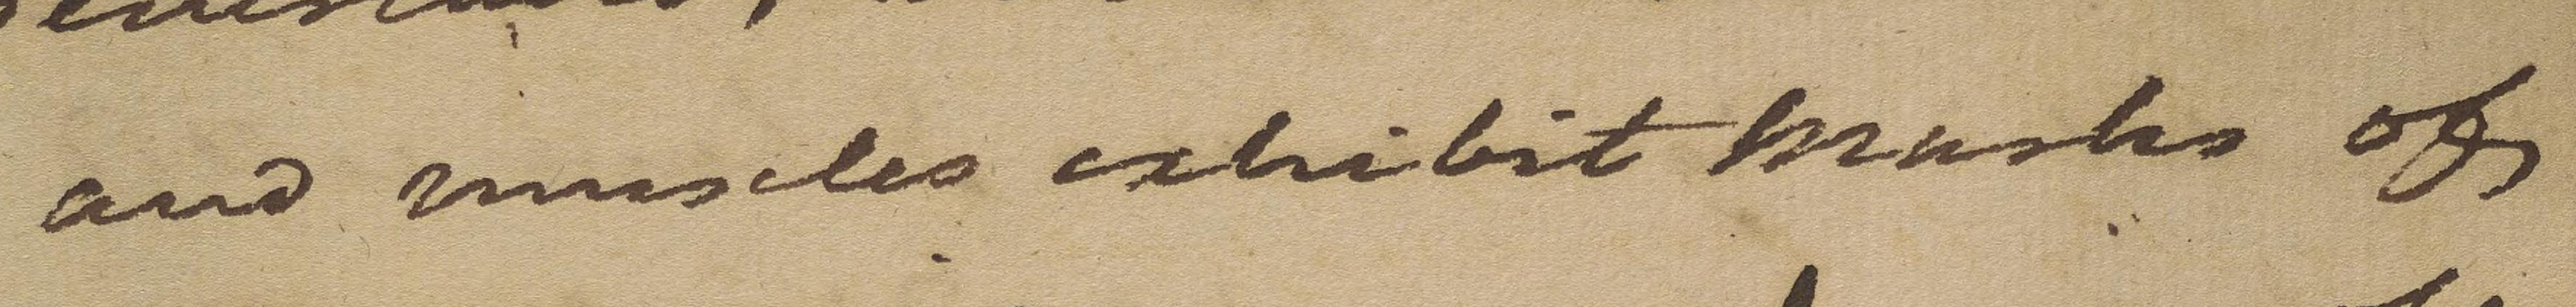and muscles exhibit marks of
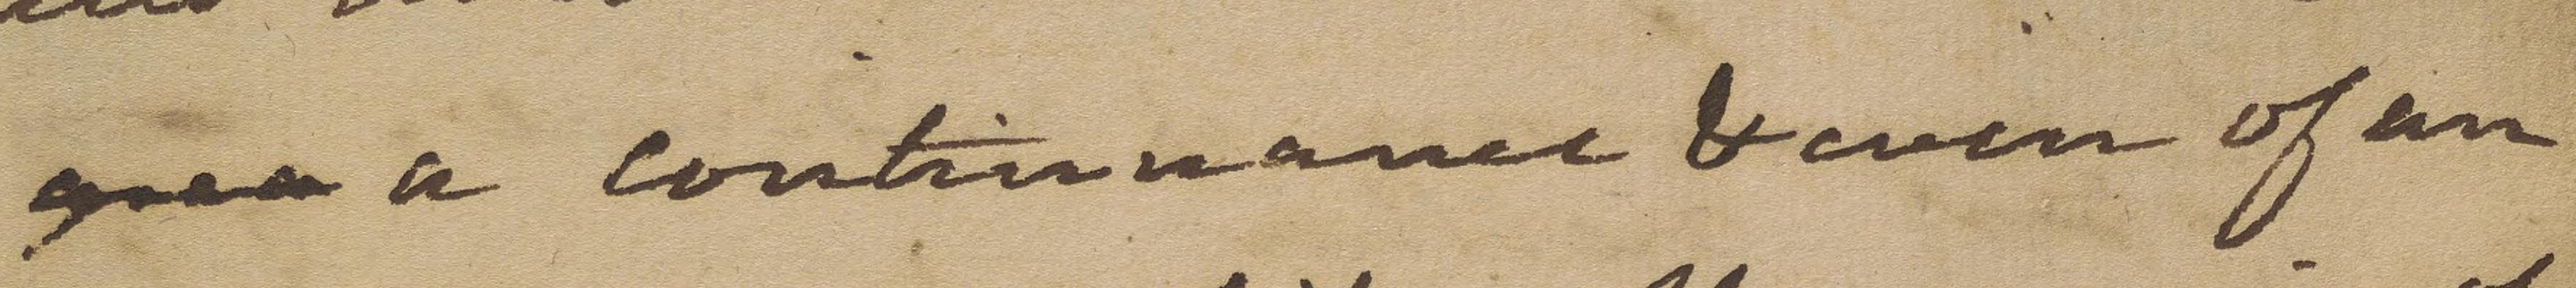[___] a continuance & even of an
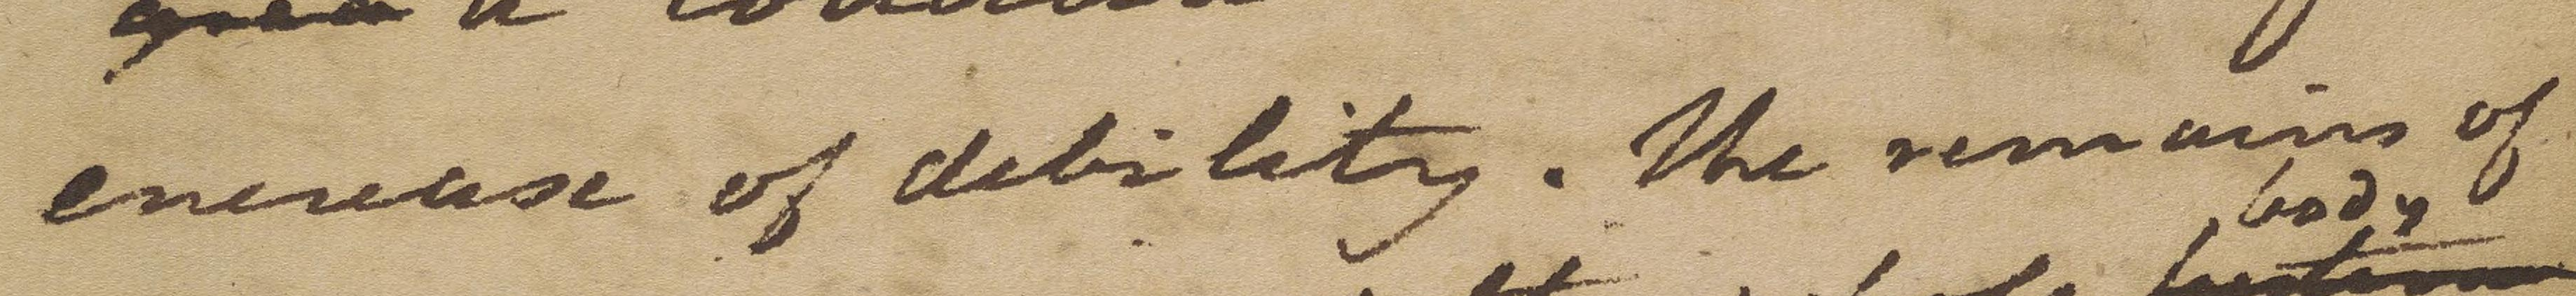encrease of debility. The remains of
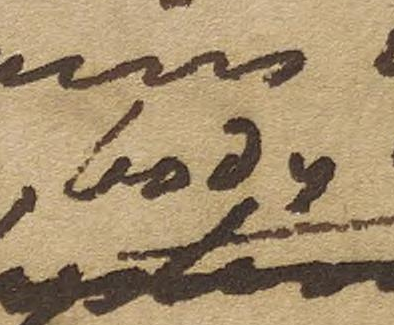body
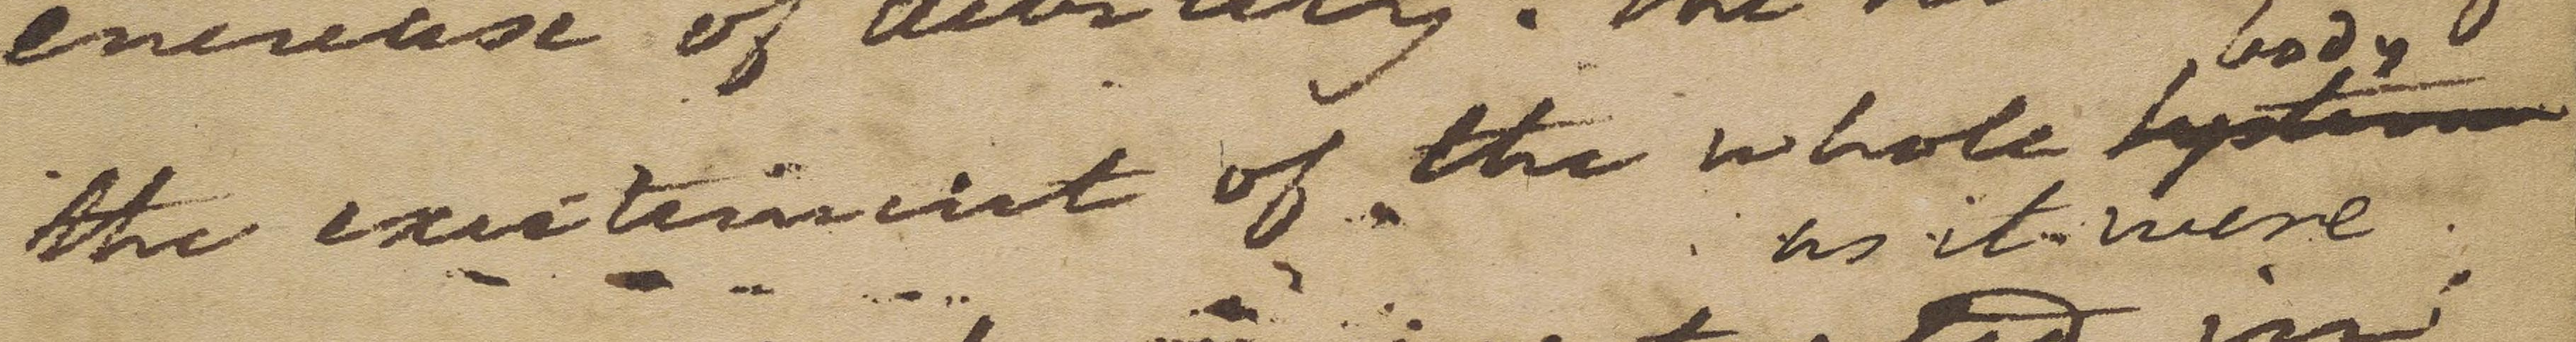the excitement of the whole [system]
